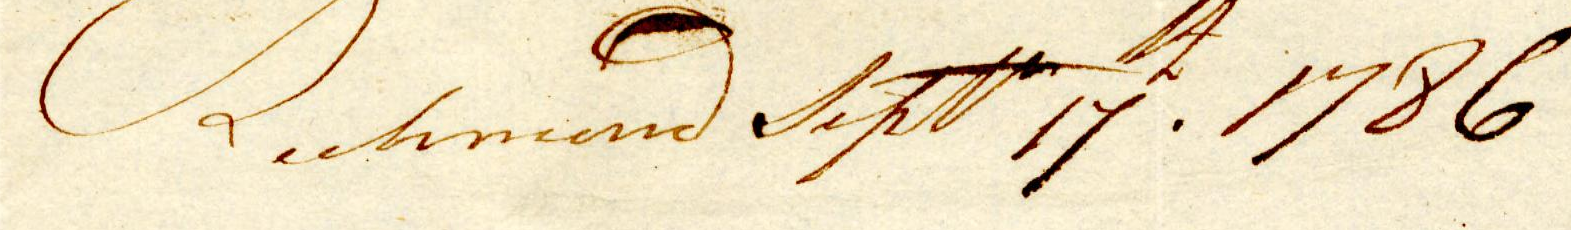Richmond Sept^r 17^th. 1786
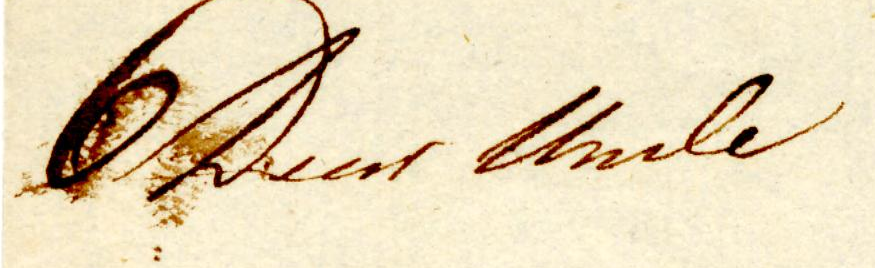Dear Uncle
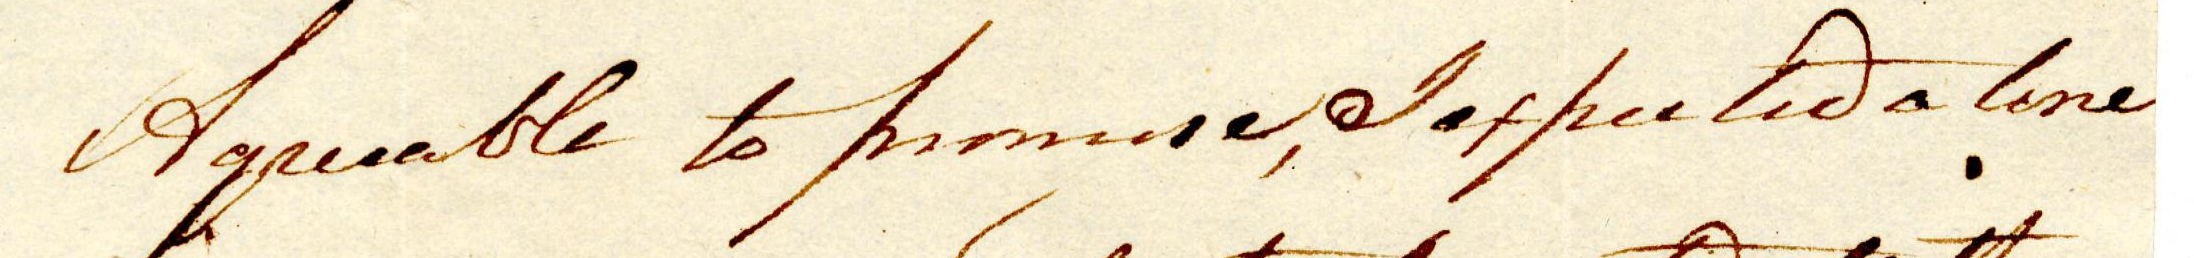Agreeable to promise, I expected a line
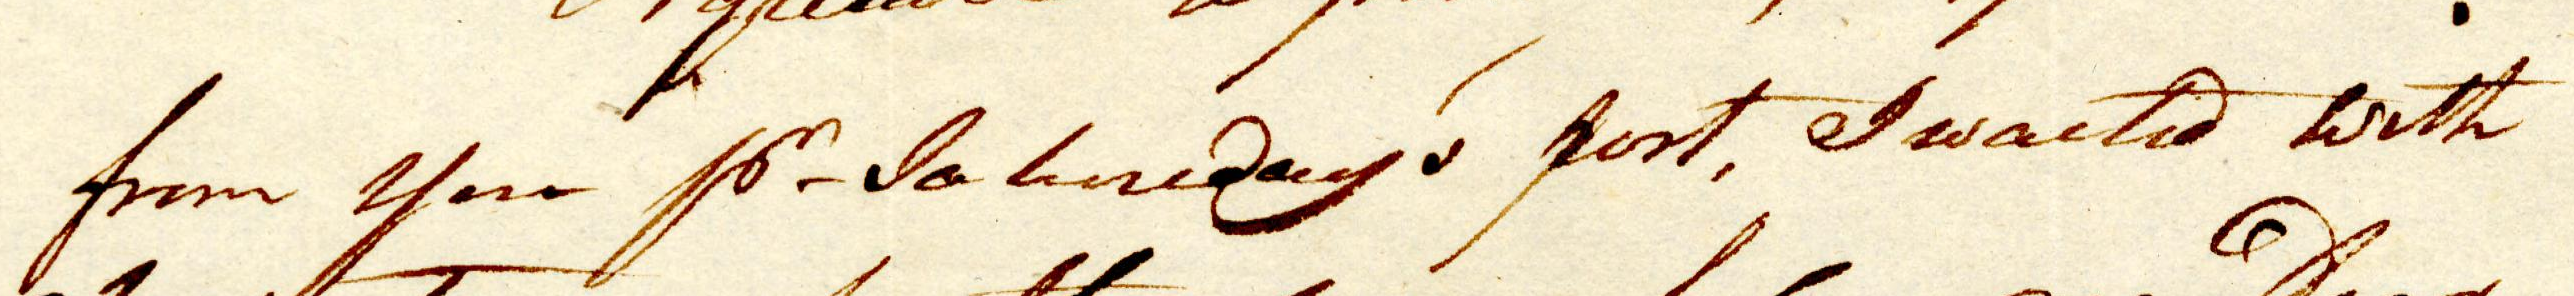from you p^r. Ja hereday's port, I waited with
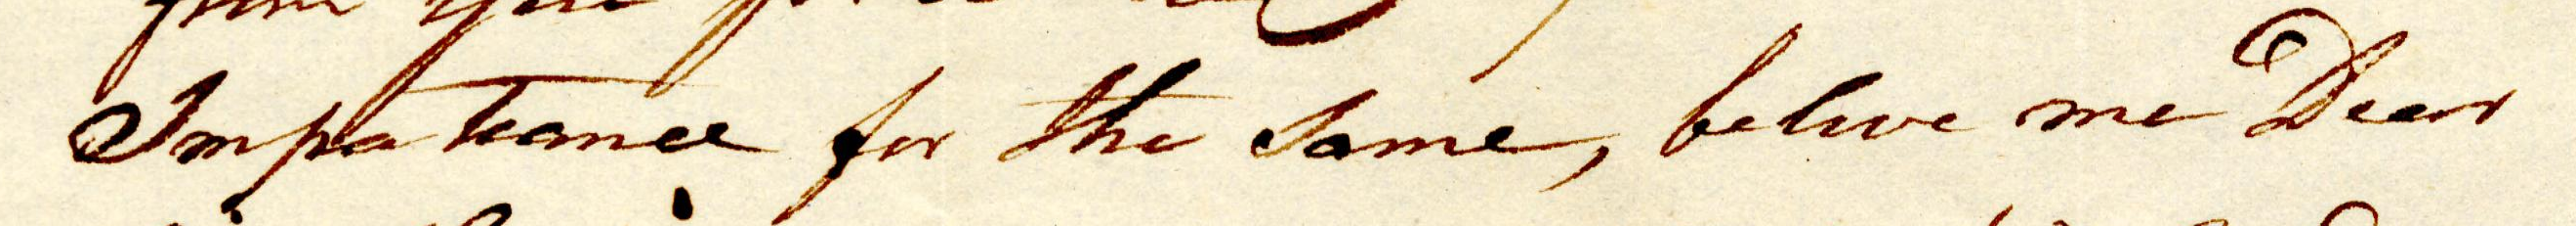Impatiance for the same, believe me Dear
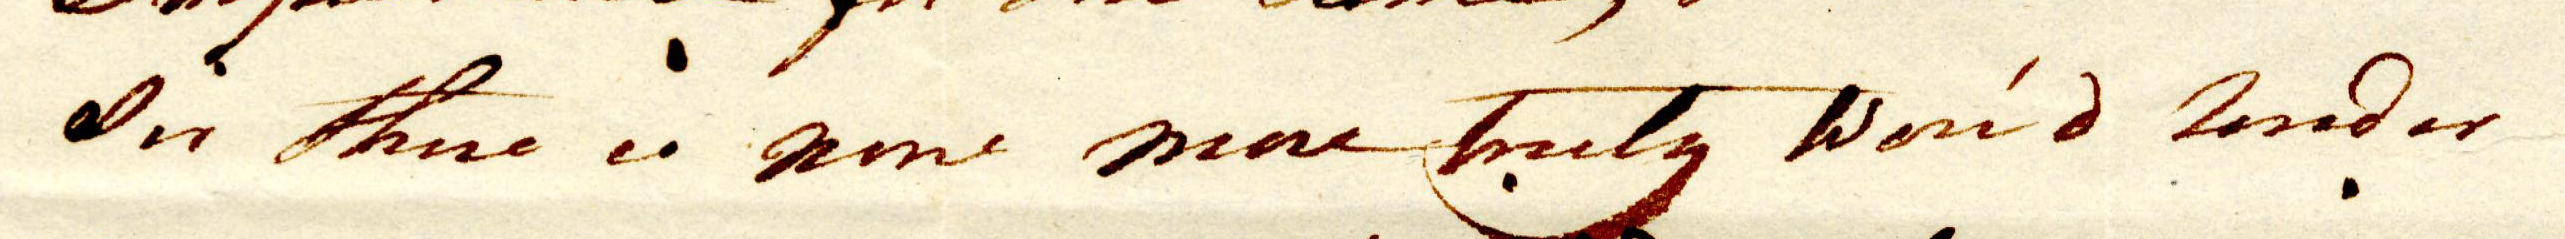Sir there is none more truly wou'd render
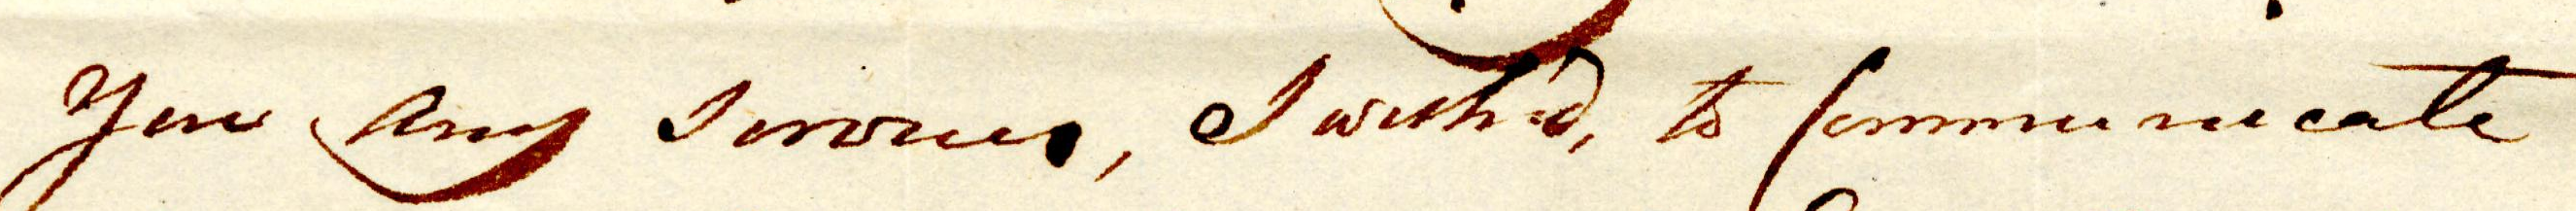you any services, I wish'd, to Communicate
